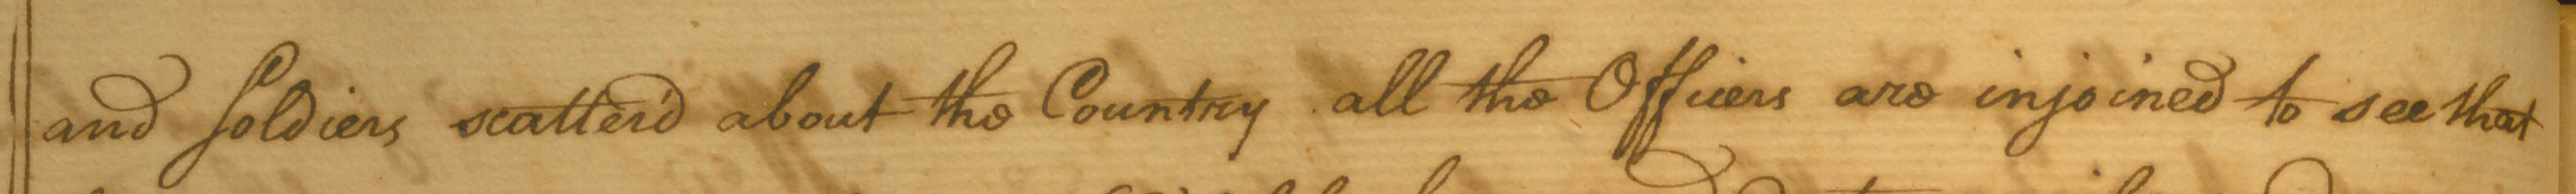and Soldiers scatter'd about the Country all the Officers are injoined to see that
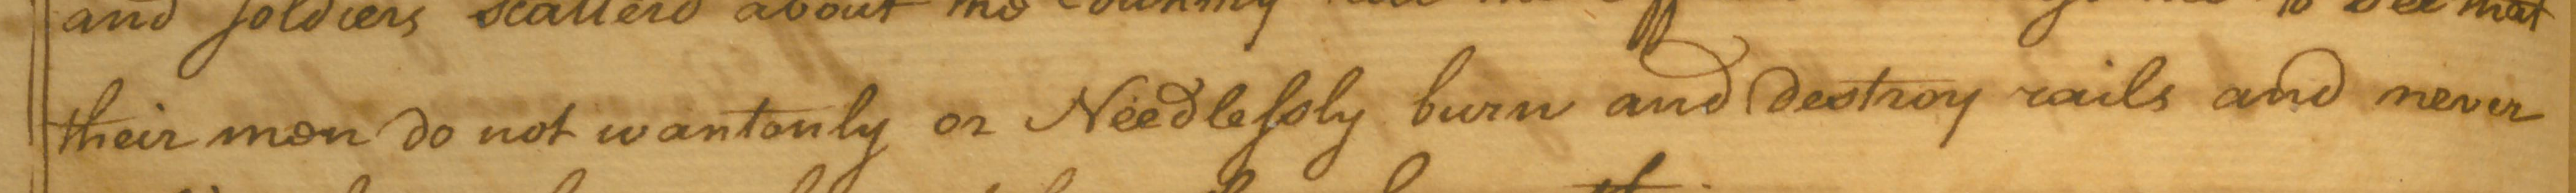their men do not wantonly or Needlessly burn and destroy rails and never
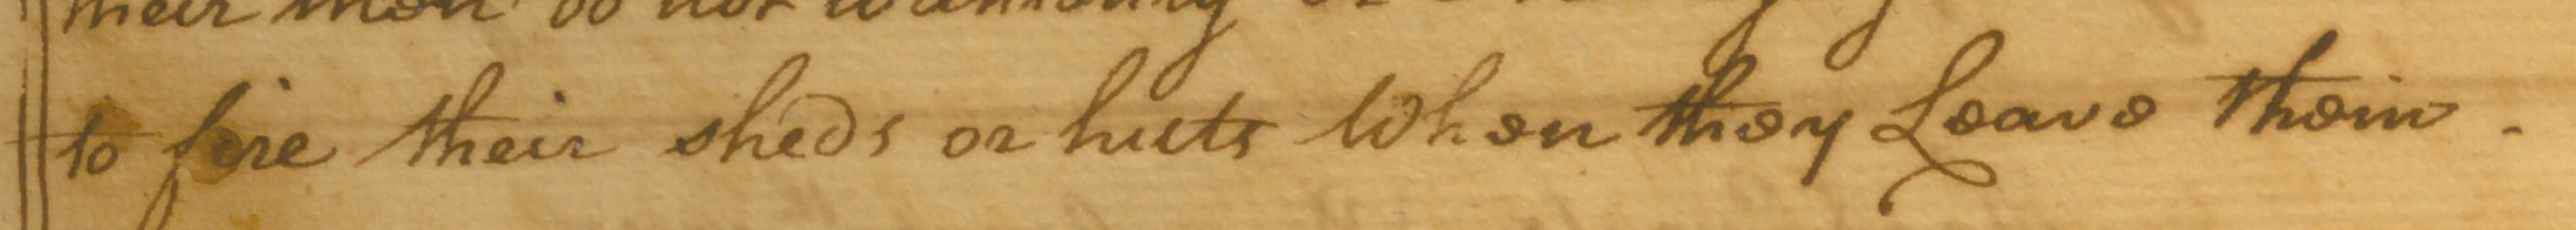to fire their sheds or huts when they Leave them.
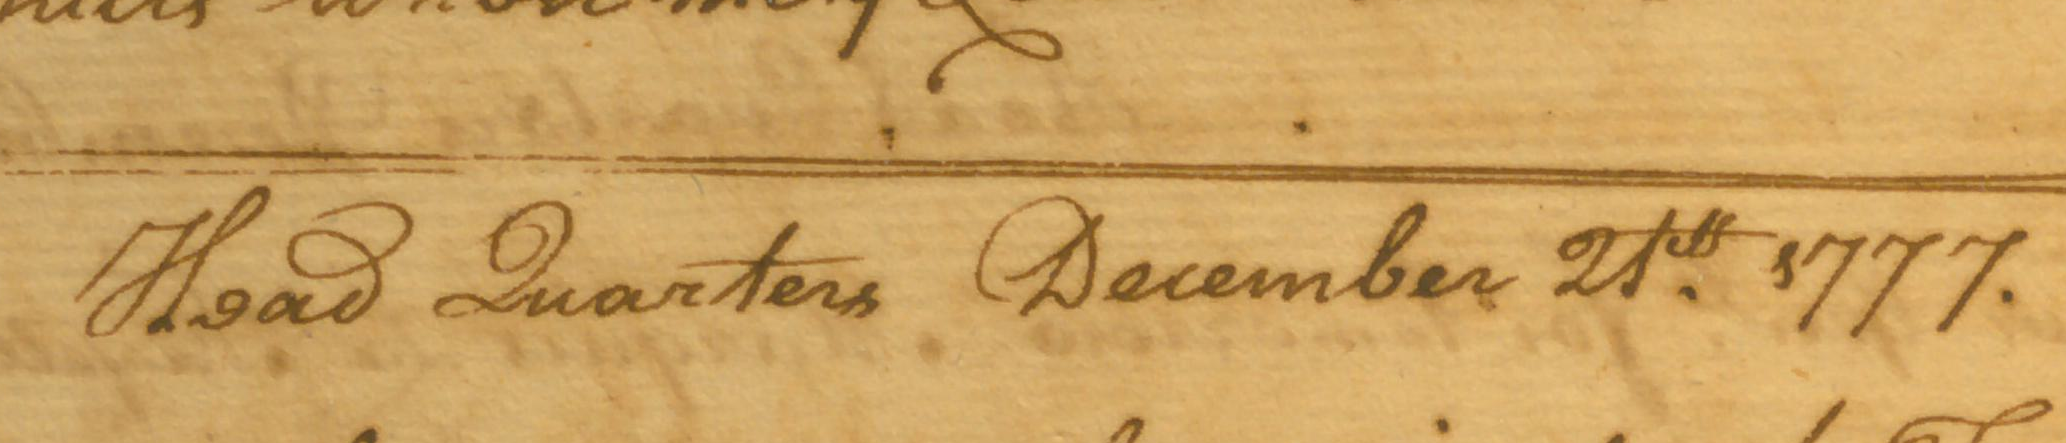Head Quarters December 21^st. 1777.
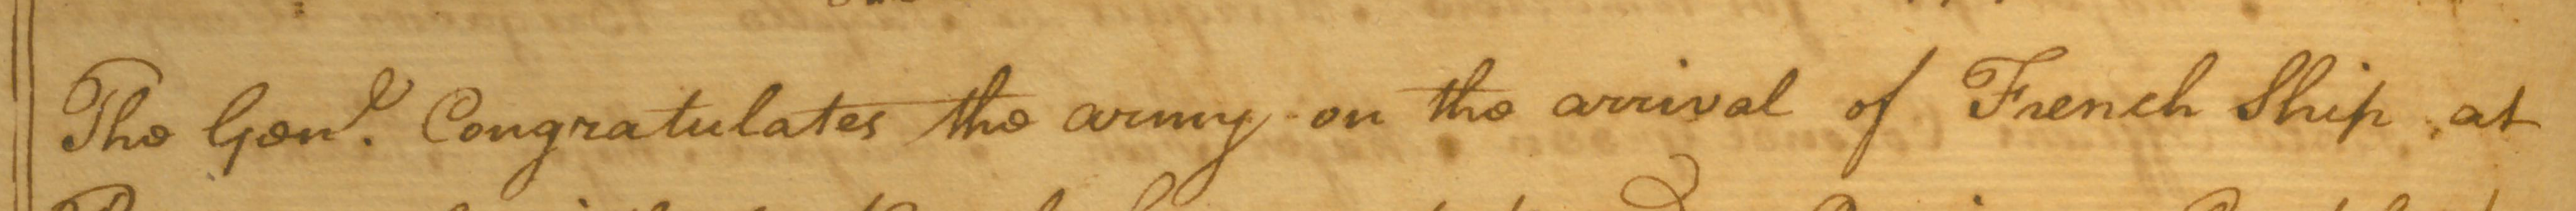The Gen^l. Congratulates the army on the arrival of French Ship at
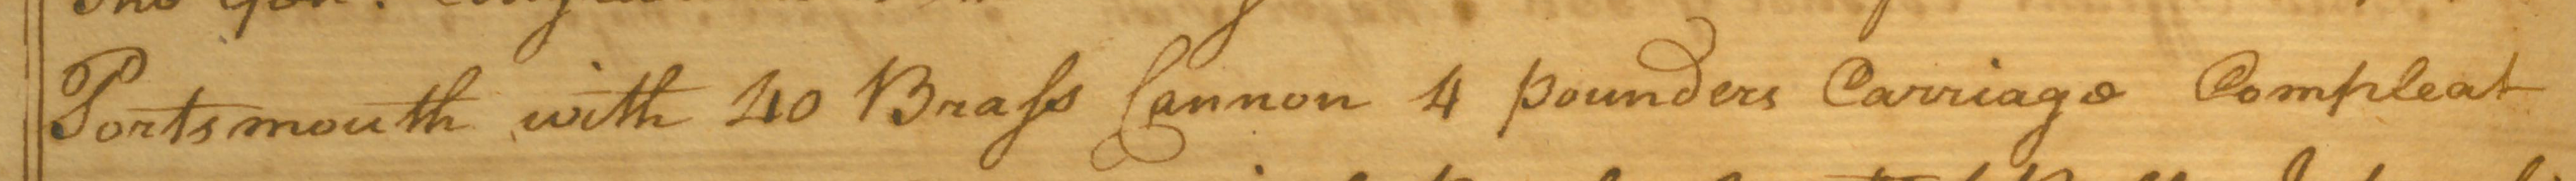Portsmouth with 40 Brass Cannons 4 pounders Carriage Compleat
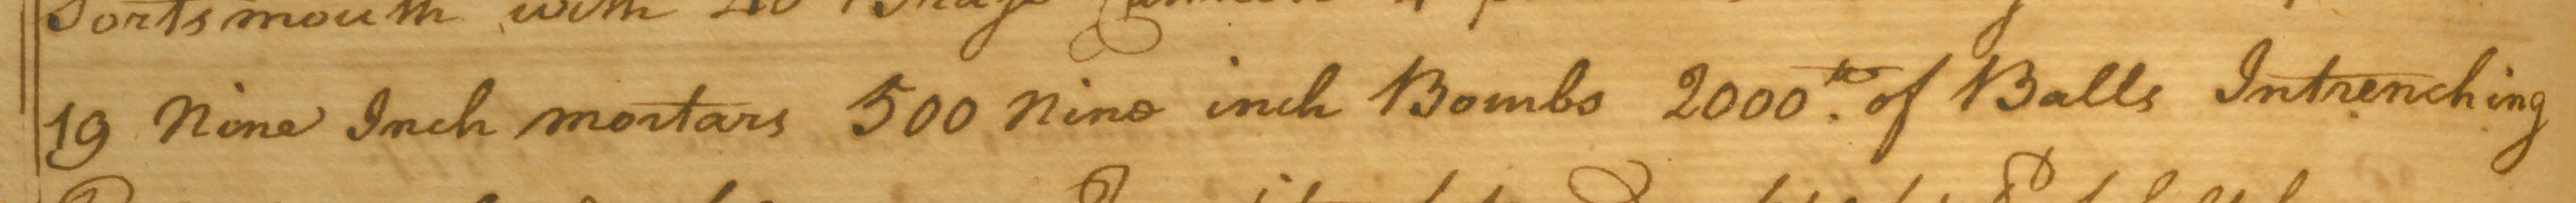19 nine Inch mortars 500 nine inch Bombs 2000^lb. of Balls Intrenching
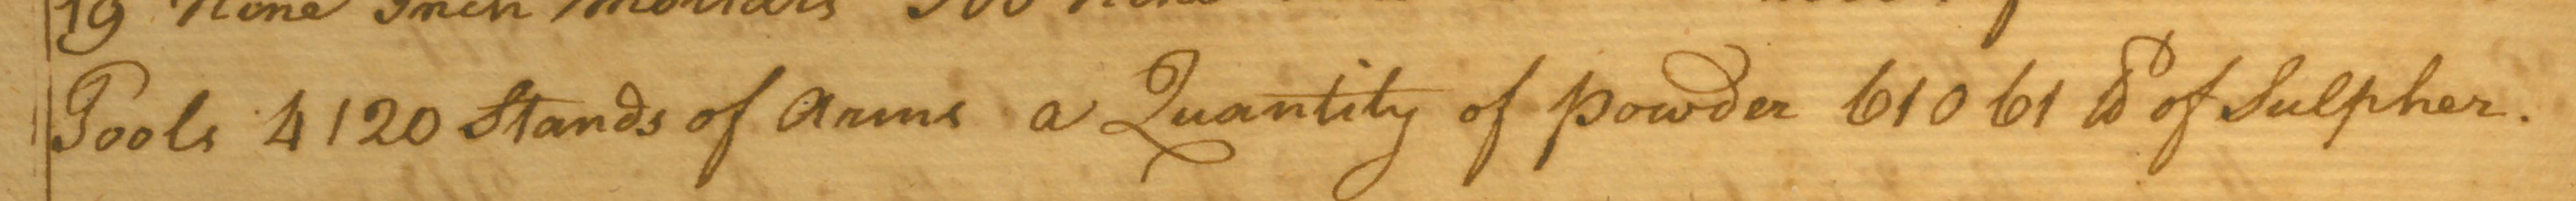Tools 4120 Stands of Arms a Quantity of power 610 61 lb of Sulpher.
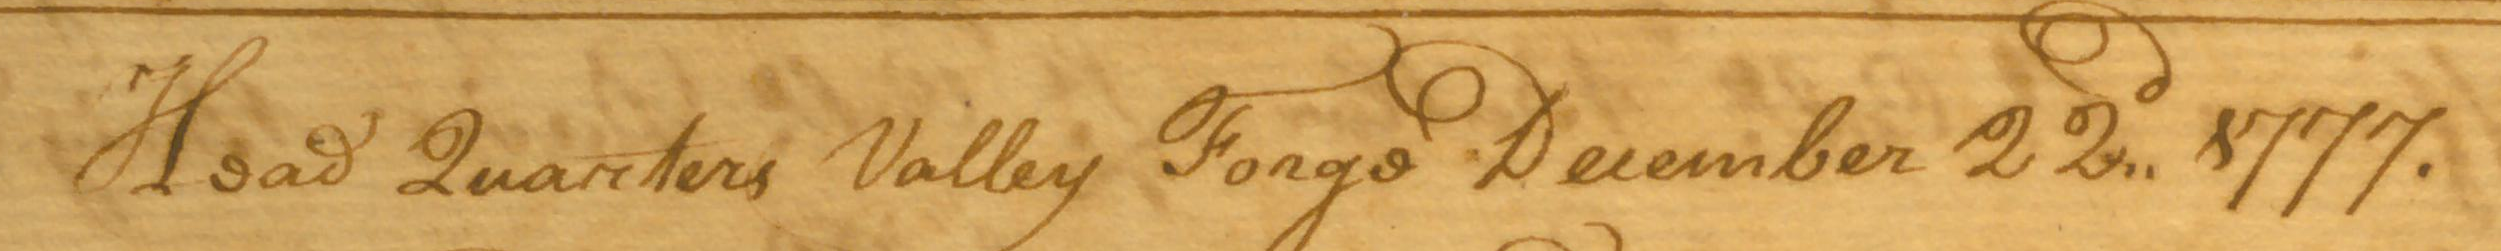Head Quarters Valley Forge December 22^d. 1777.
